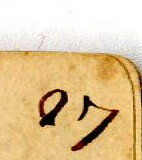27
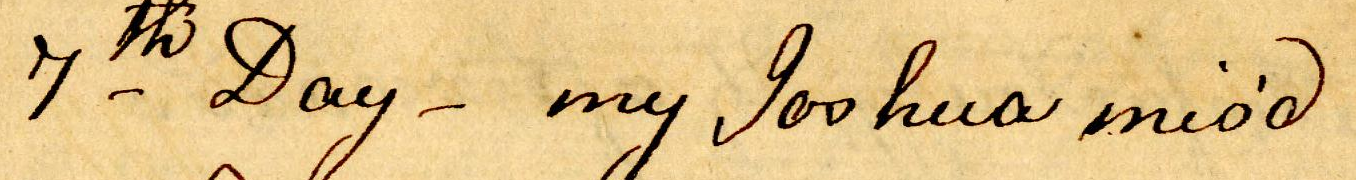7^th Day- my Joshua mis'd
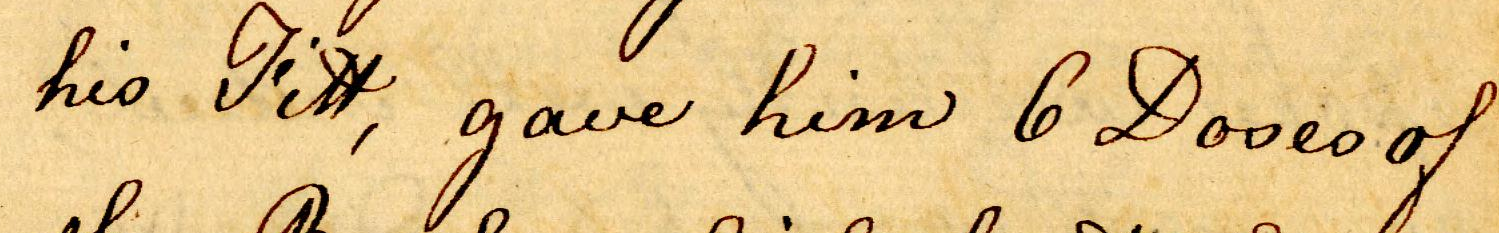his Fitt, gave him 6 Doses of
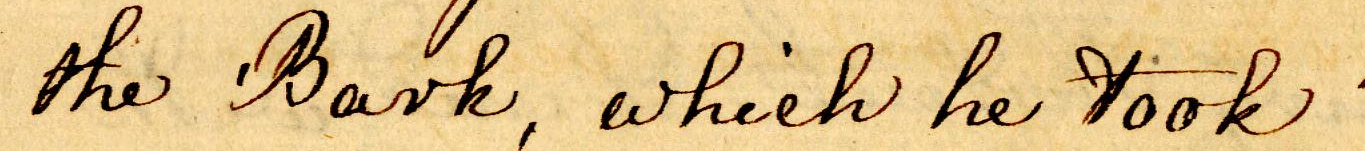the Bark, which he took
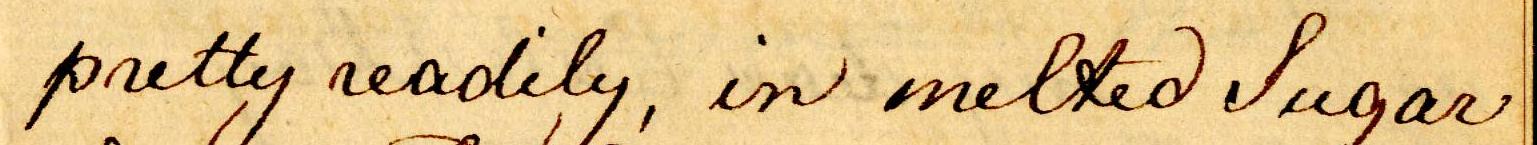pretty readily, in melted Sugar
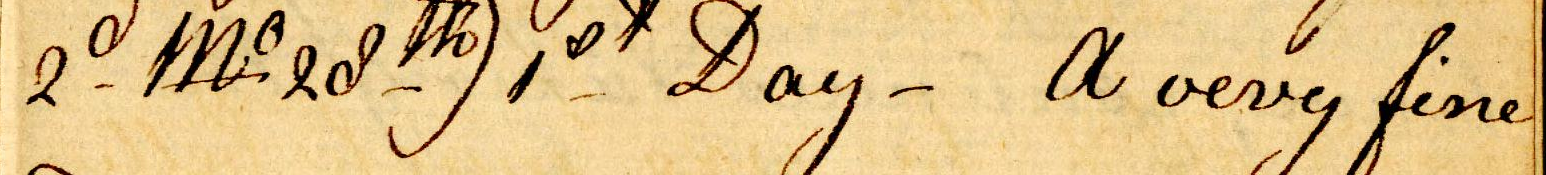2^d M^o 28^th)1^st Day- A very fine
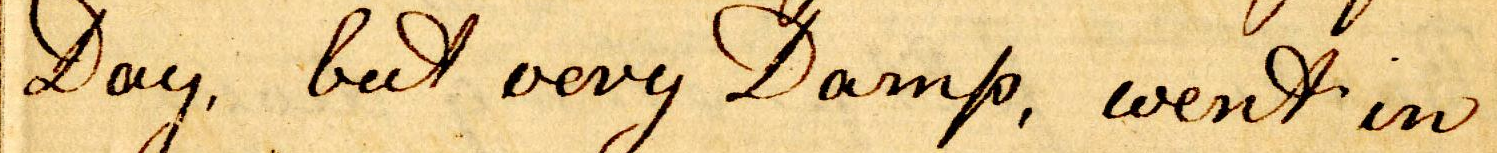Day, but very Damp, went in
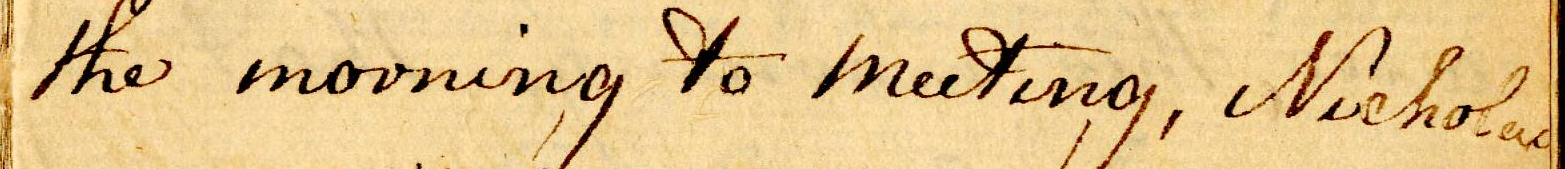the morning to Meeting, Nicholas
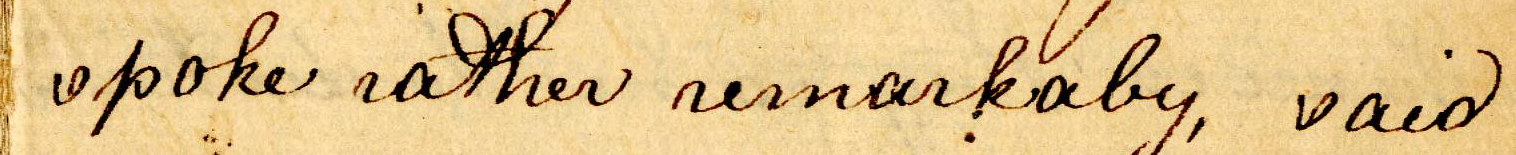spoke rather remarkaby, said
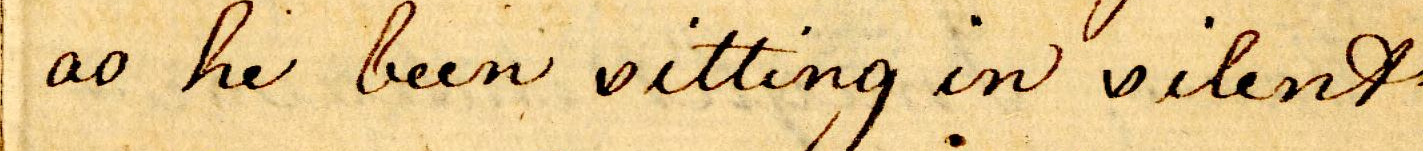as he been sitting in silent
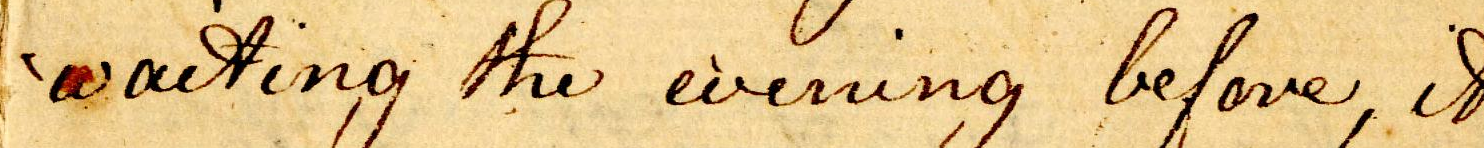waiting the evening before, it
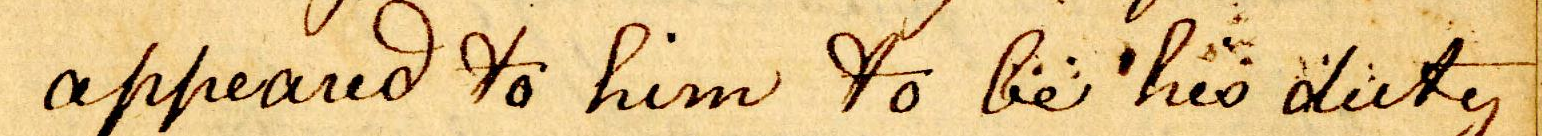appeared to him to be his duty
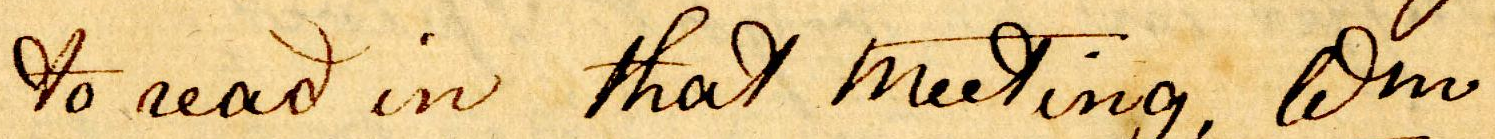to read in that Meeting, W^m
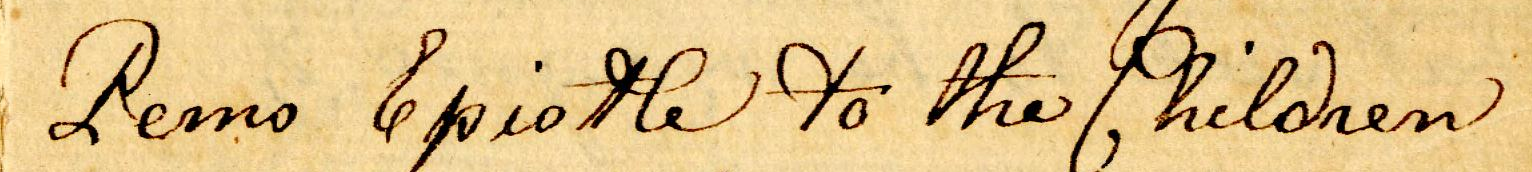Pems Epistle to the Children
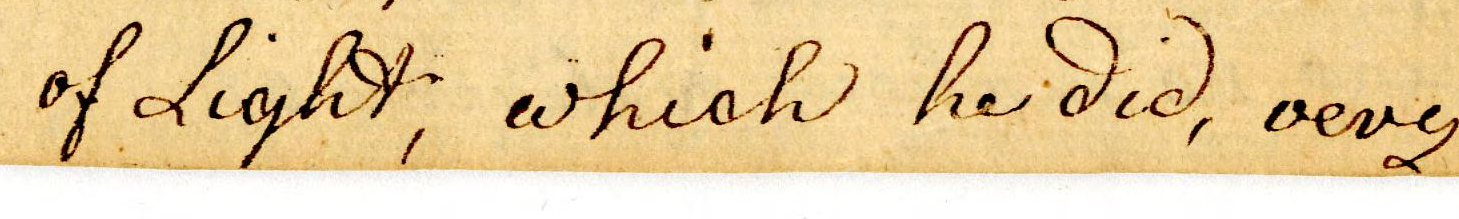of Light, which he did, very
